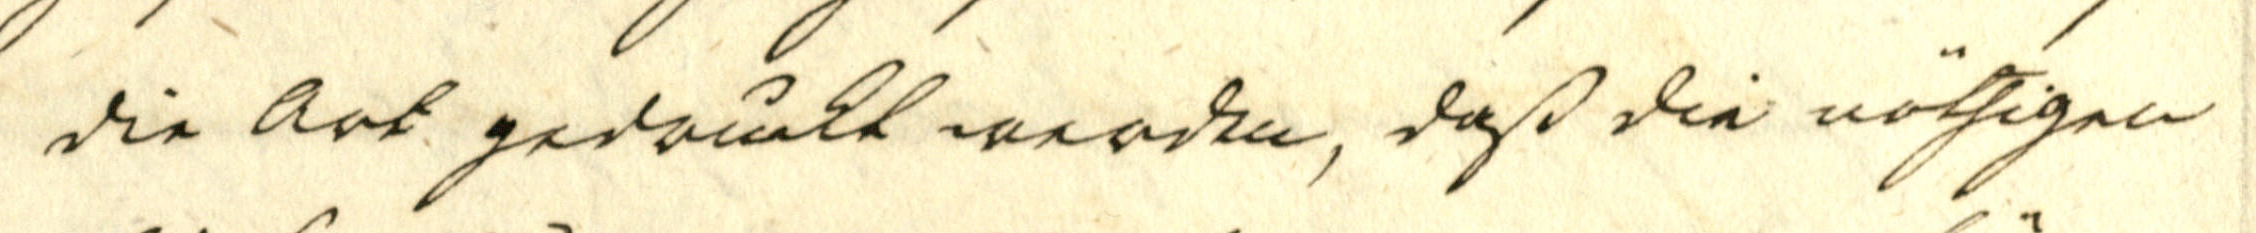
die Art gedruckt werden, daß die nöthigen
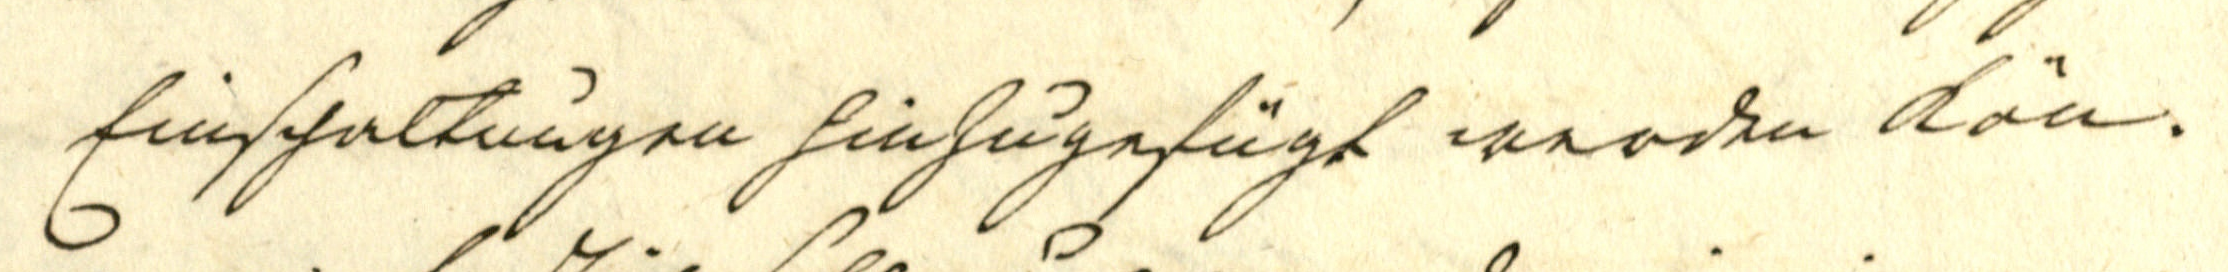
Einschaltungen hinzugefügt werden kön-
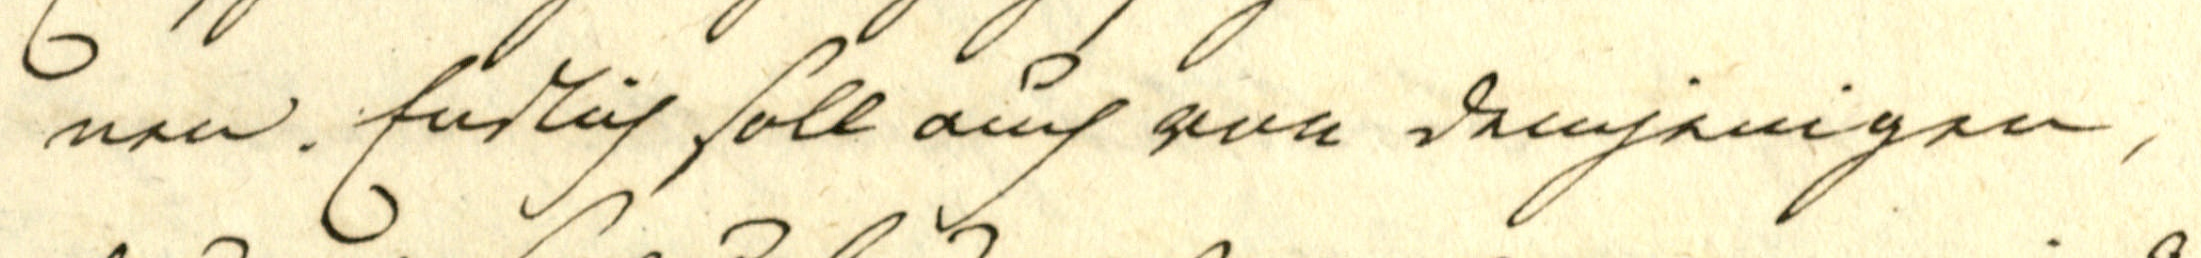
nen. Endlich soll auch von demjenigen,
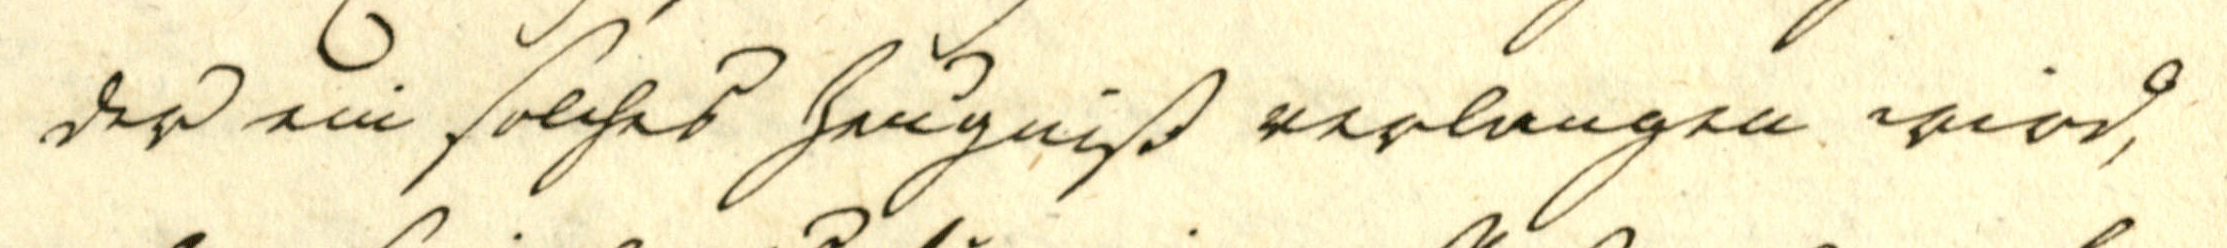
der ein solches Zeugniß verlangen wird,
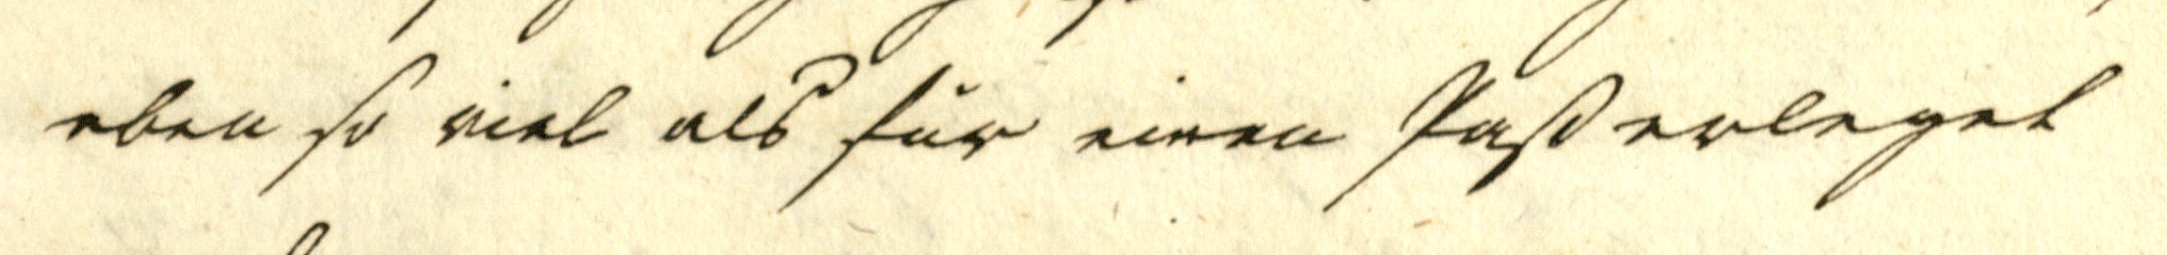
eben so viel als für einen Paß erleget
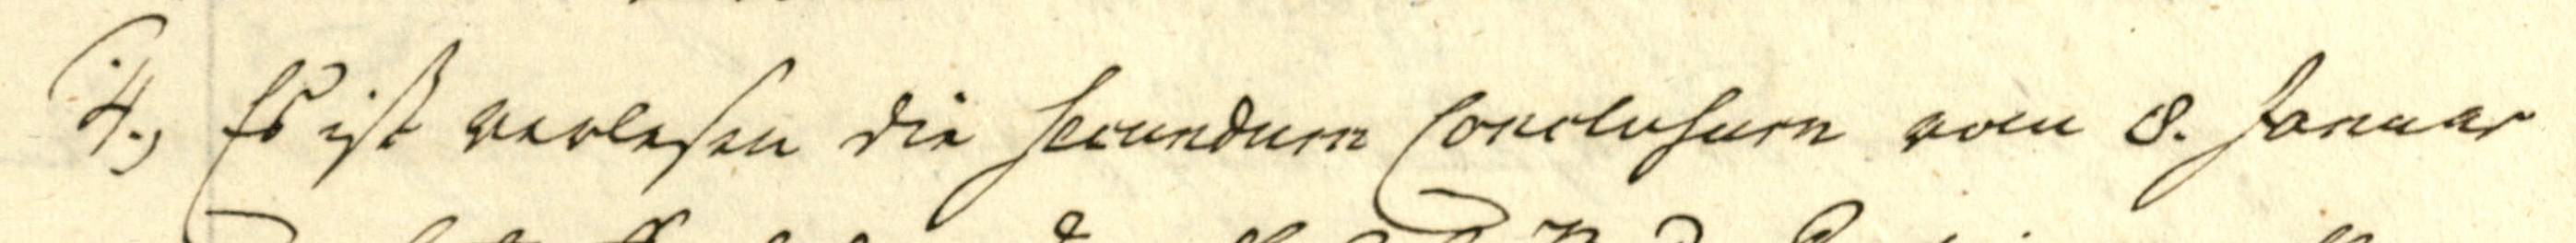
4., Es ist verlesen die secundum Conclusum vom 8. Januar
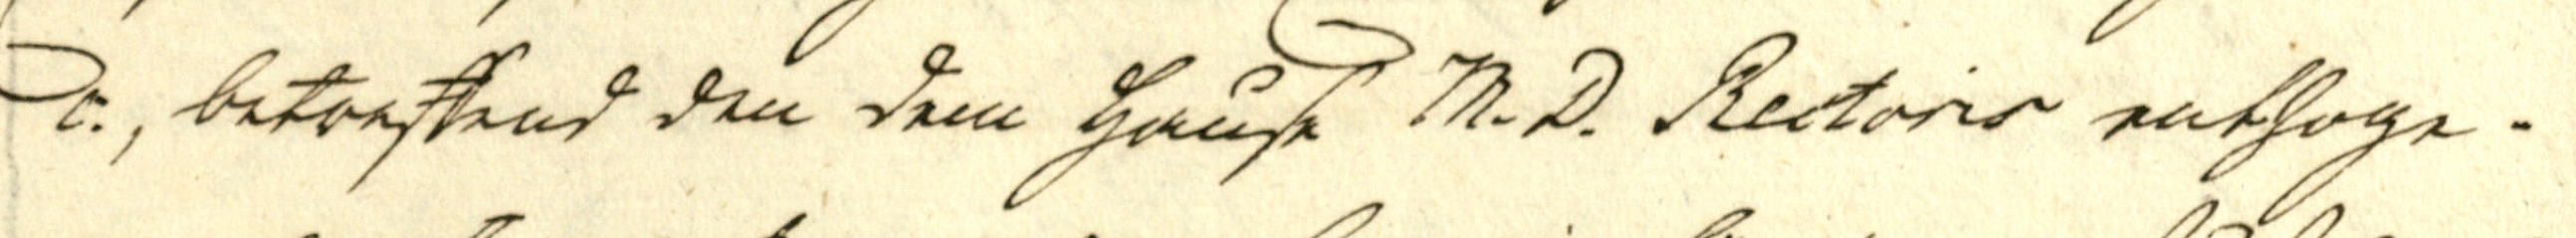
c., betreffend den dem Hause M. D. Rectoris entzoge-
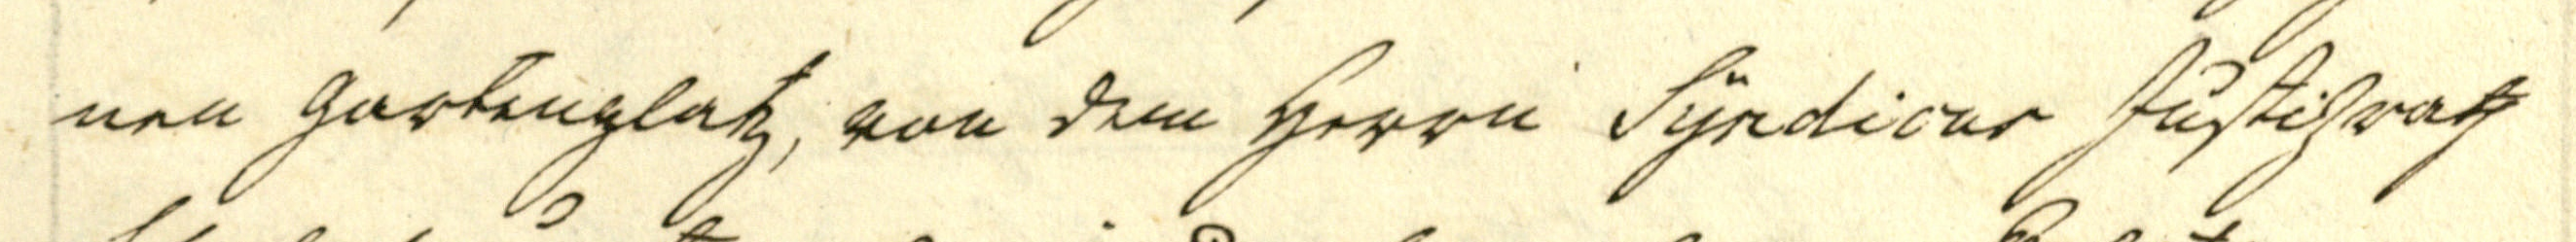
nen Gartenplatz, von dem Herrn Sÿndicus Justizrath
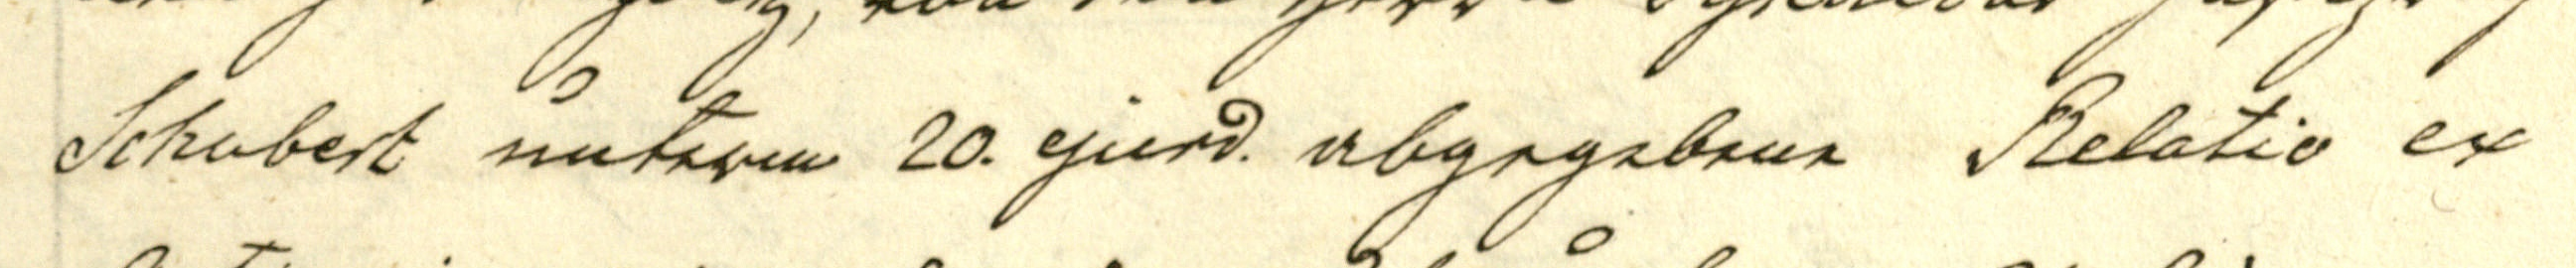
Schubert unterm 20 ejusd. abgegebene Relatio ex
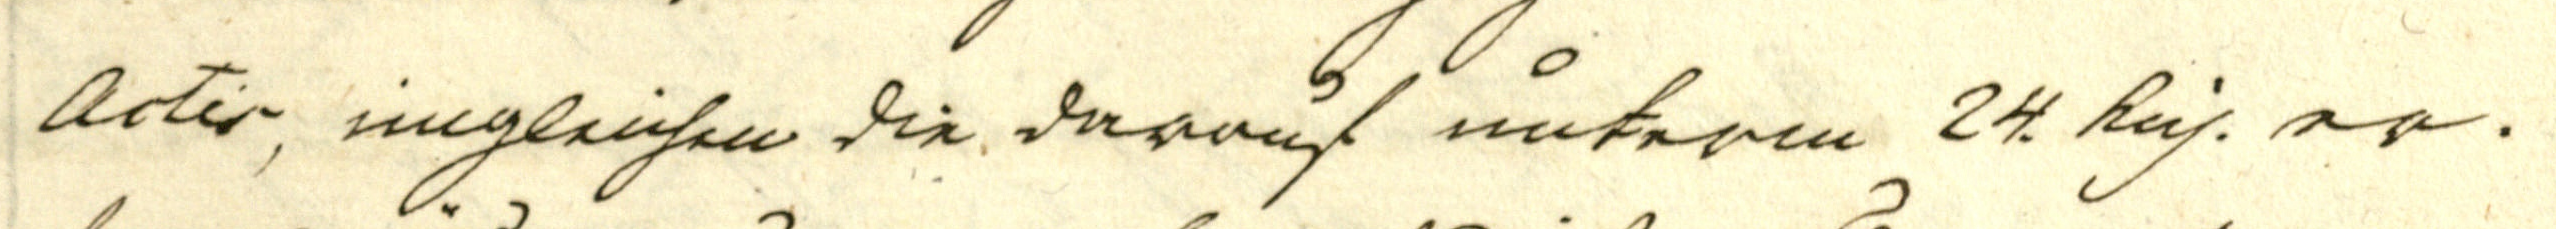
Actis, imgleichen die darauf unterm 24 huj. er¬
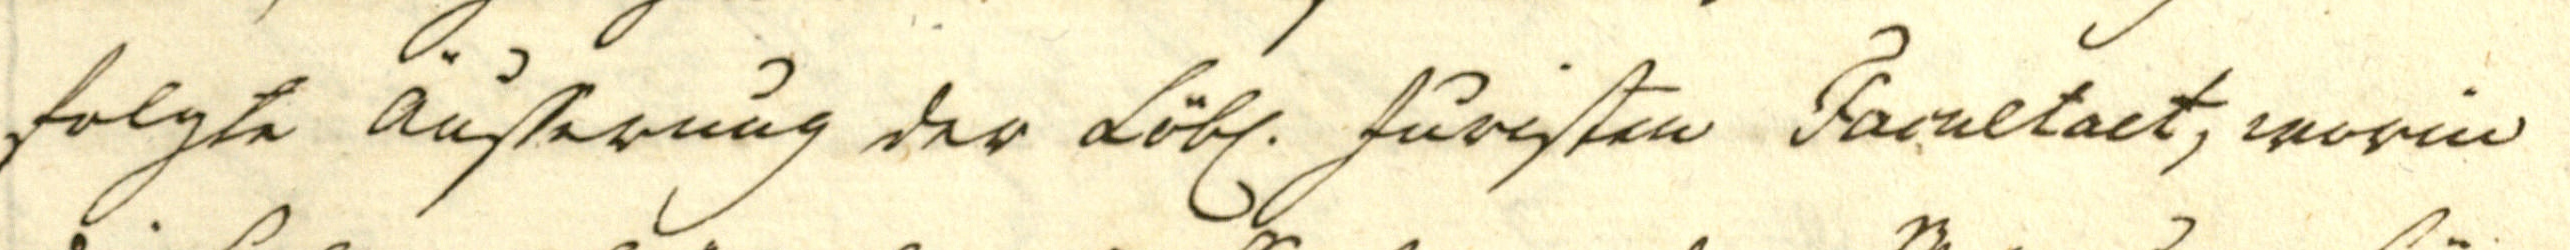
folgte Äusserung der Löbl. Juristen Facultaet, worin
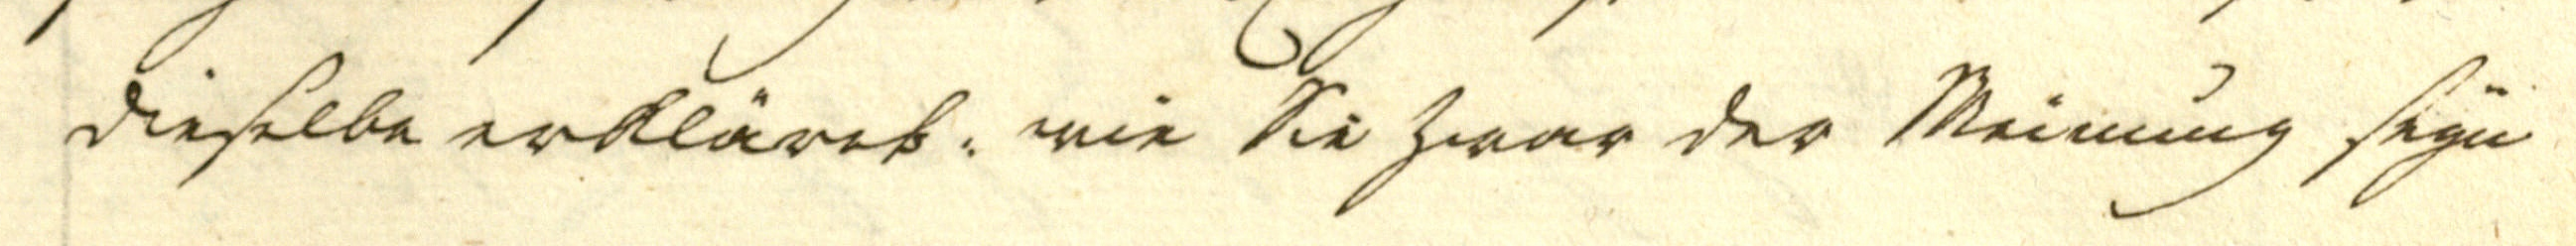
dieselbe erkläret: wie Sie zwar der Meinung seÿn
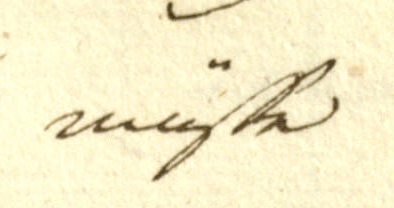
müsse
